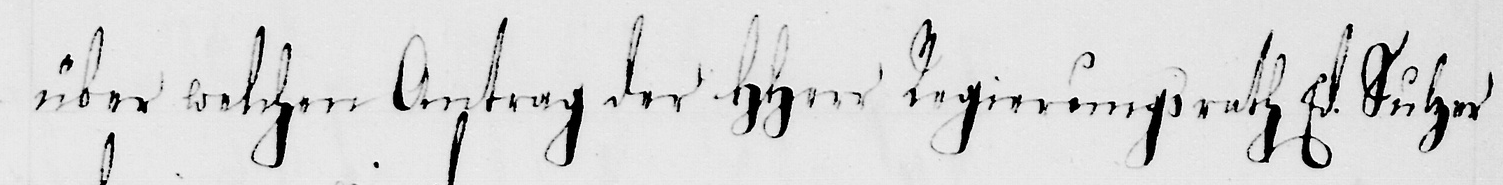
über welchen Antrag der HHerr Regierungsrath Ed. Sulzer
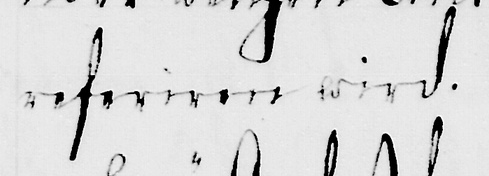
referiren wird.
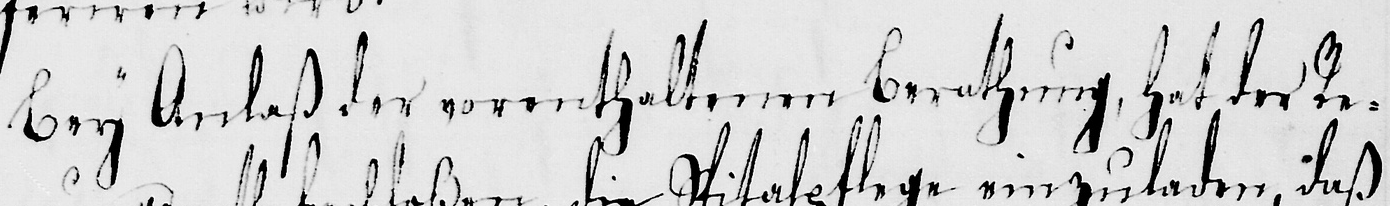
Bey Anlaß der vorenthaltenen Berathung, hat der Re¬
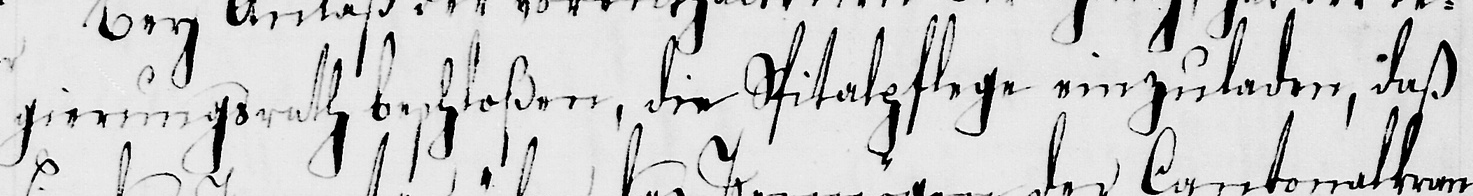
gierungsrath beschloßen, die Spitalpflege einzuladen, daß
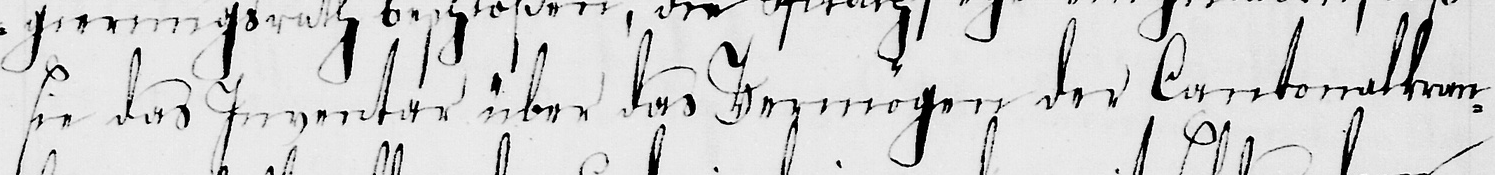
sie das Inventar über das Vermögen der Cantonalkran¬
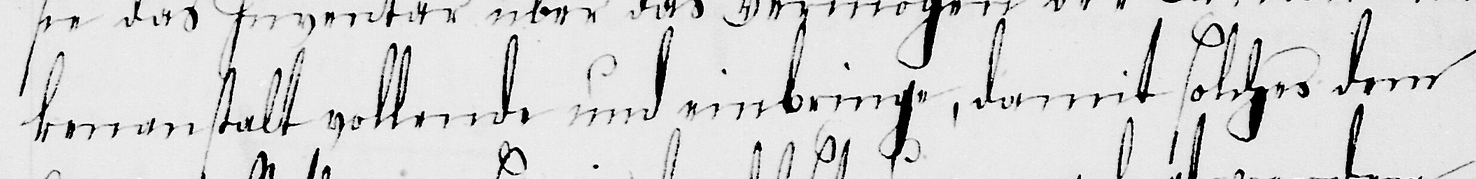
kenanstalt vollende und einbringe, damit solches dem
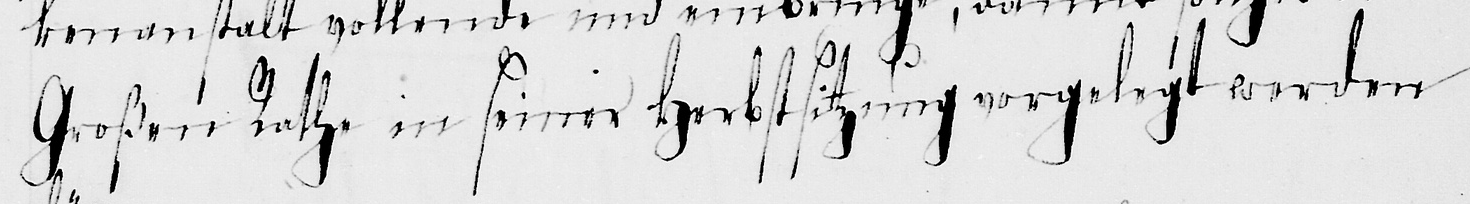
Großen Rathe in seiner Herbstsitzung vorgelegt werden
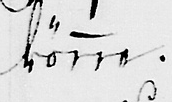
könne.
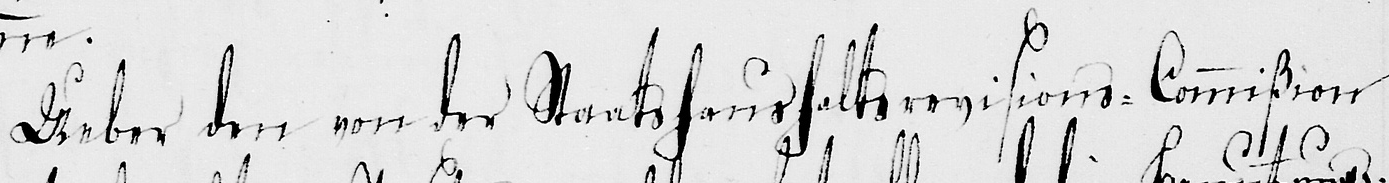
Ueber den von der Staatshaushaltsrevisions-Commißion
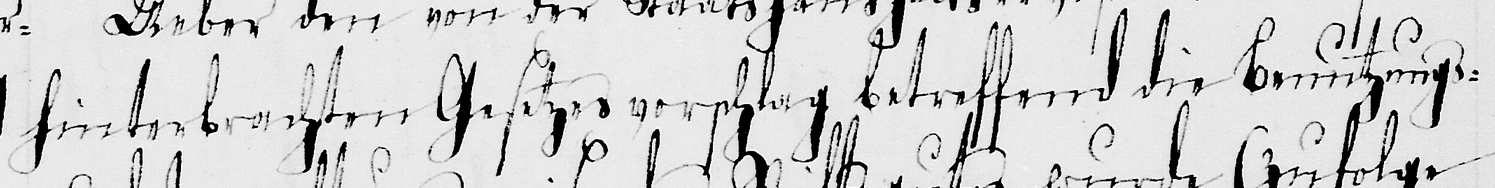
hinterbrachten Gesetzesvorschlag betreffend die Benutzungs-
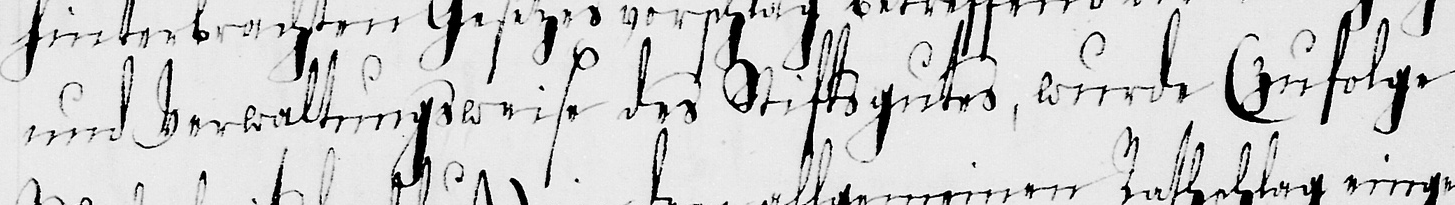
und Verwaltungsweise des Stiftsgutes, wurde (zufolge
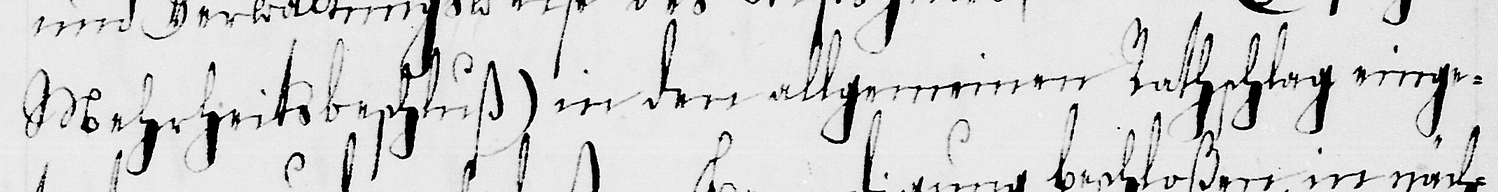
Mehrheitsbeschluß) in den allgemeinen Rathschlag einge¬
